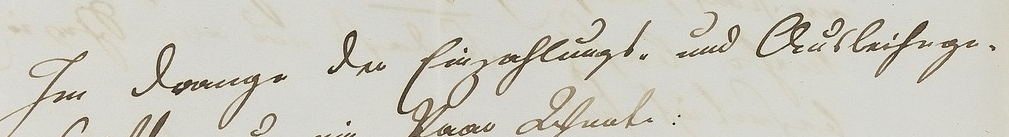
Im Drange der Einzahlungs- und Ausleihege-
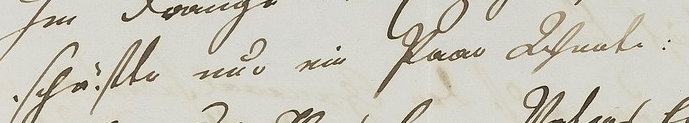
schäfte nur ein Paar Worte:
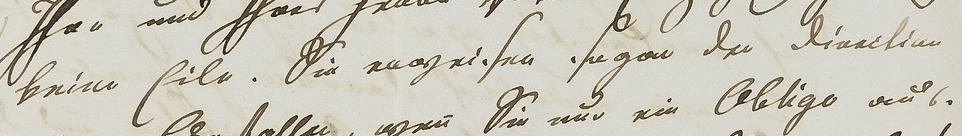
keine Eile. Sie erweisen sogar der Direction
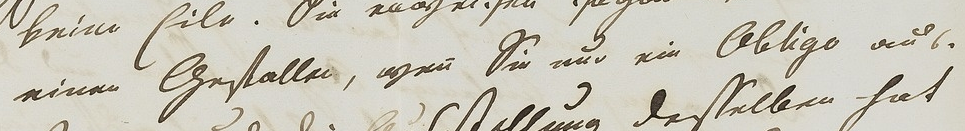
einen Gefallen, wenn Sie nur ein Obligo aus-
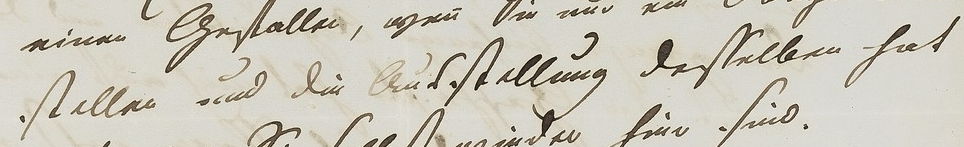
stellen und die Ausstellung desselben hat
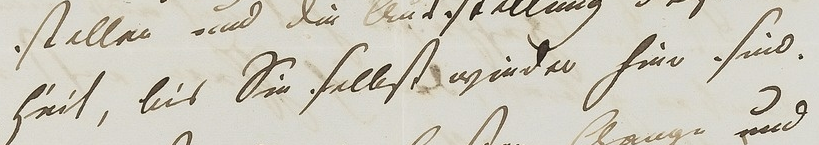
Zeit, bis Sie selbst wieder hier sind.
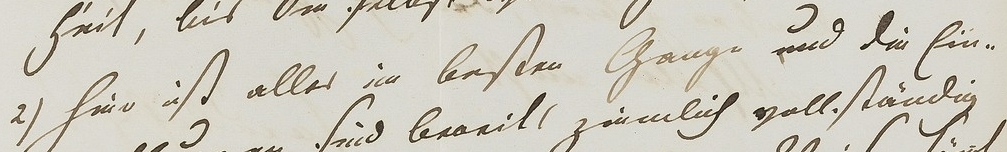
2) Hier ist alles im besten Gange und die Ein-
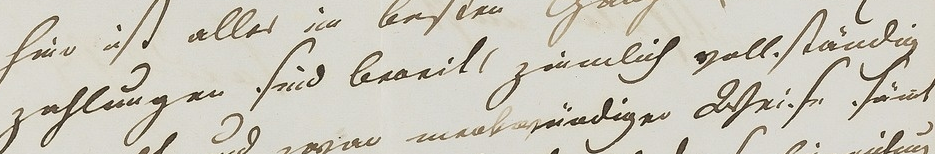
zahlungen bereits ziemlich vollständig
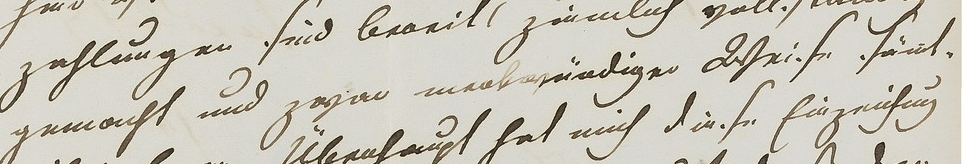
gemacht und zwar merkwürdiger Weise sämmt-
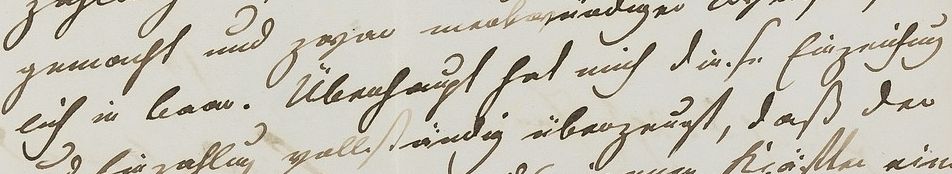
lich in baar. Überhaupt hat mich diese Einzeichnung
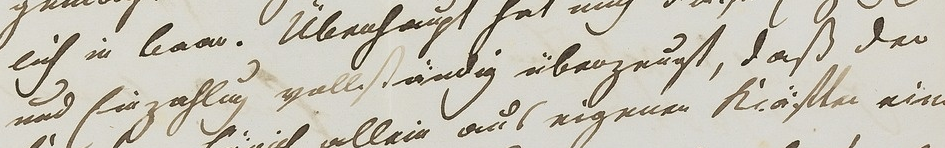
und Einzahlung vollständig überzeugt, daß der
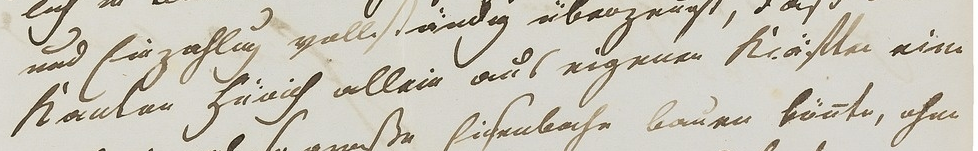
Kanton Zürich allein aus eigenen Kräften eine
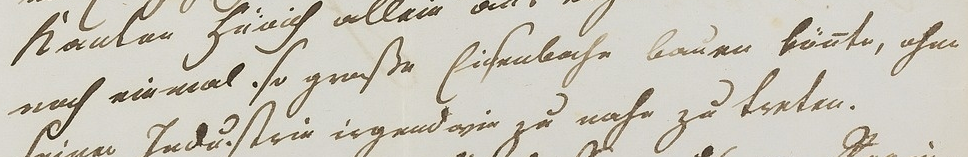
noch einmal so große Eisenbahn bauen könnte, ohne
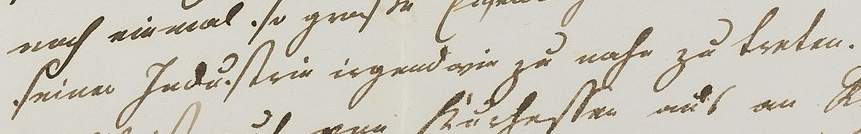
seiner Industrie irgendwie zu nahe zu treten.
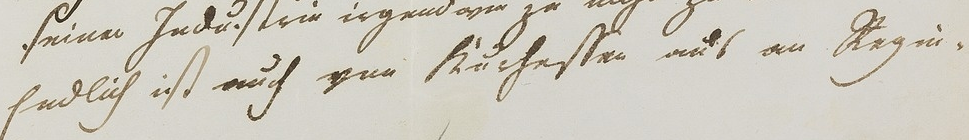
Endlich ist auch von Kurhessen aus an Regie-
